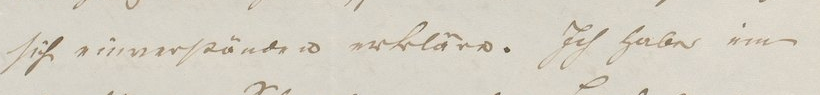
sich einverständen erkläre. Ich habe ein
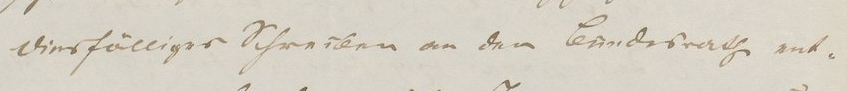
diesfälliges Schreiben an den Bundesrath ent-
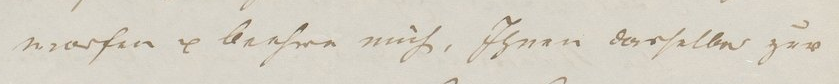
worfen & beehre mich, Ihnen dasselbe zur
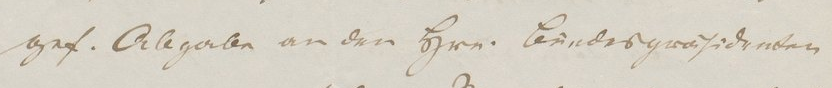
gef. Abgabe an den Hrn. Bundespräsidenten
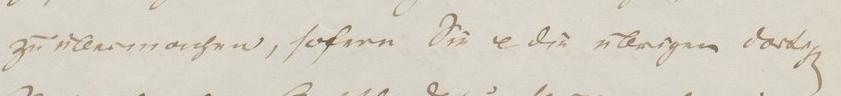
zu übermachen, sofern Sie & die übrigen dortigen
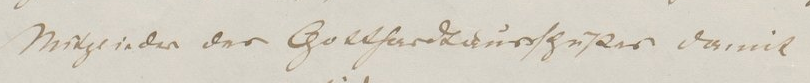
Mitglieder des Gotthardtausschußes damit
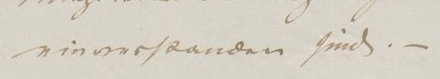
einverstanden sind. –
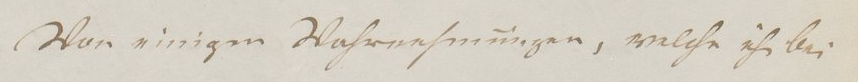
Von einigen Wahrnehmungen, welche ich bei
